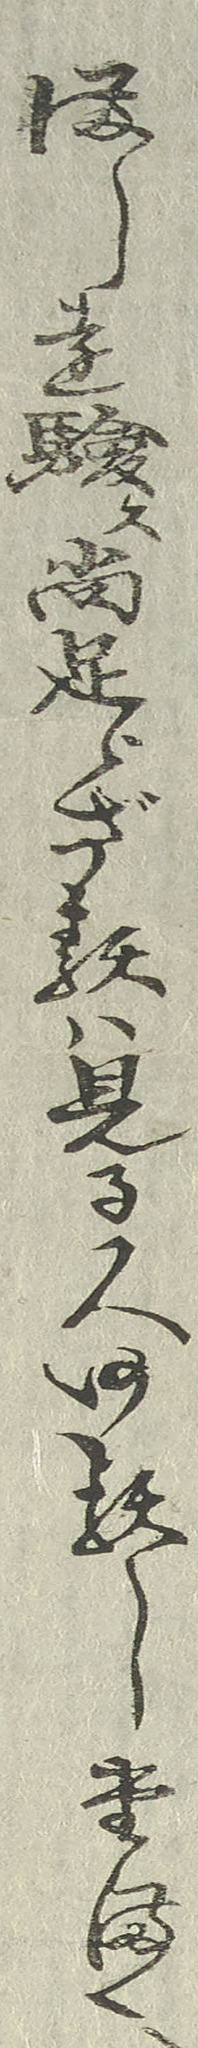ましを験す尚足らざるは見る人ゆるしたまへ
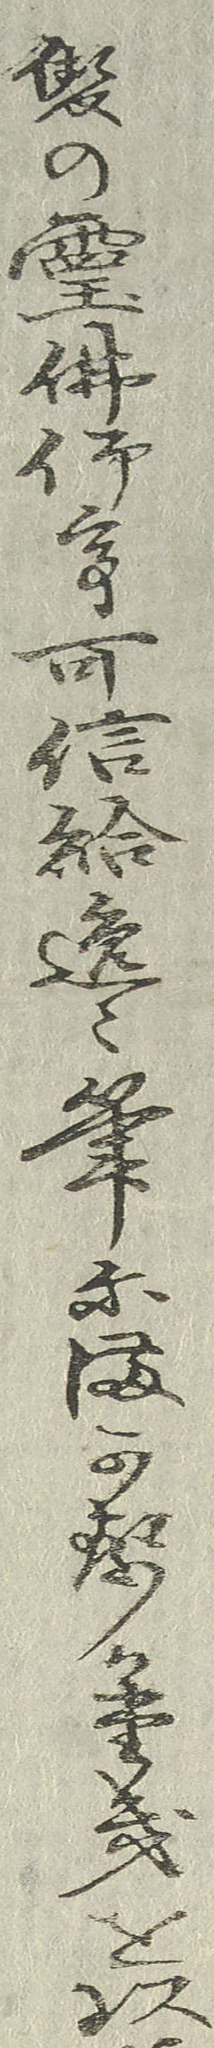双の霊仏仰て可信給逸々筆にまかせかたきを以あら
